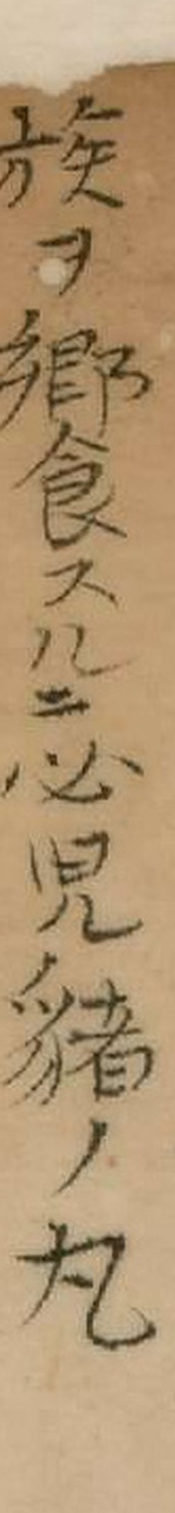族ヲ饗スルニ必児猪ノ丸
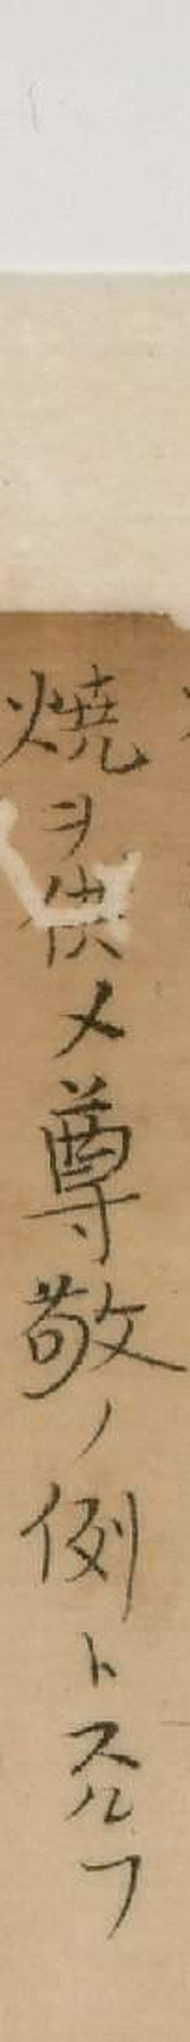焼ヲ供シテ尊敬ノ例トスルヿ
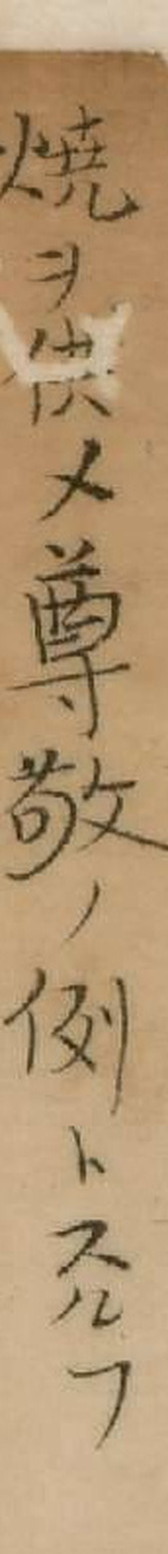焼ヲ供シテ尊敬ノ例トスルヿ
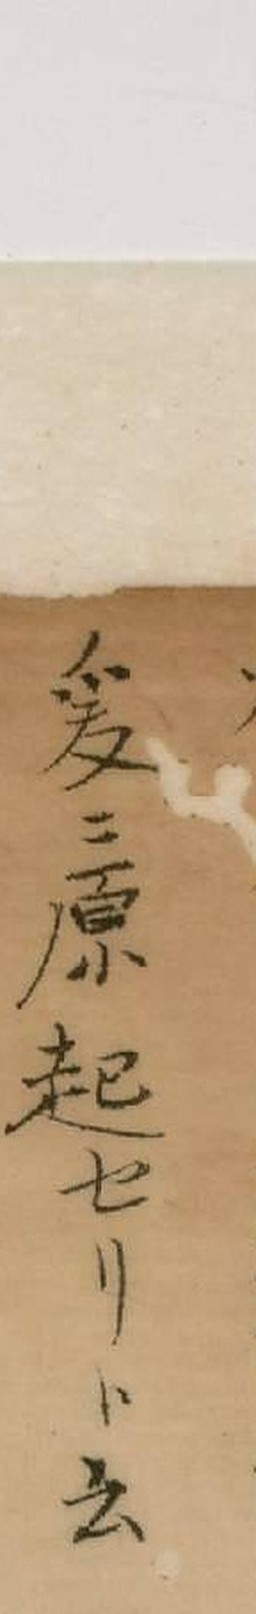爰ニ原起セリト云
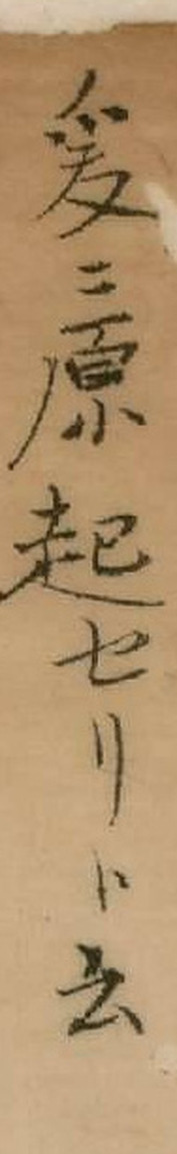爰ニ原起セリト云

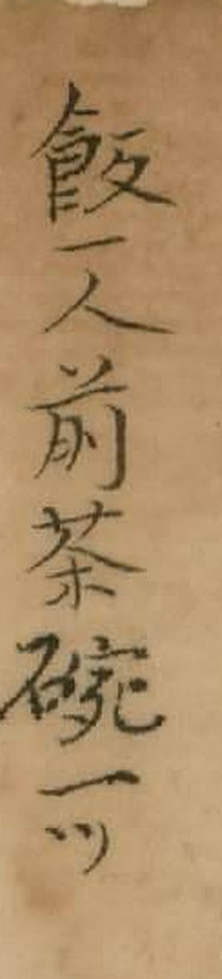飯一人前茶碗一ツ
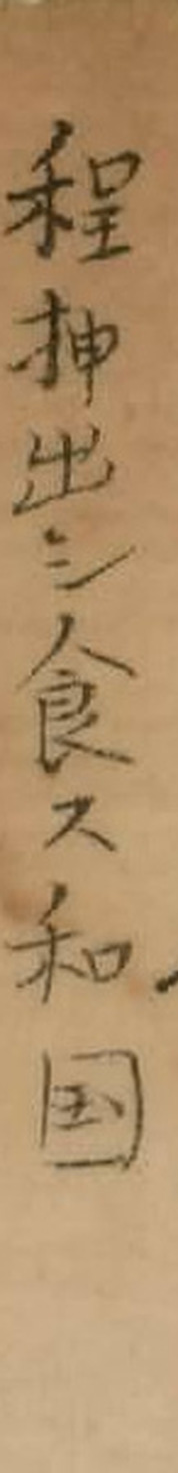程押出シ食ス和国
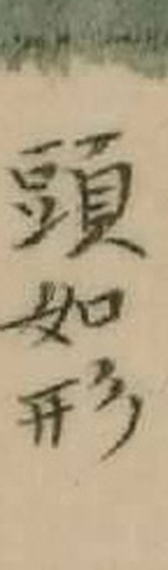頭如形
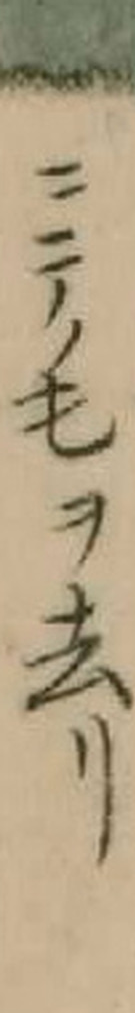ニテ毛ヲ去リ
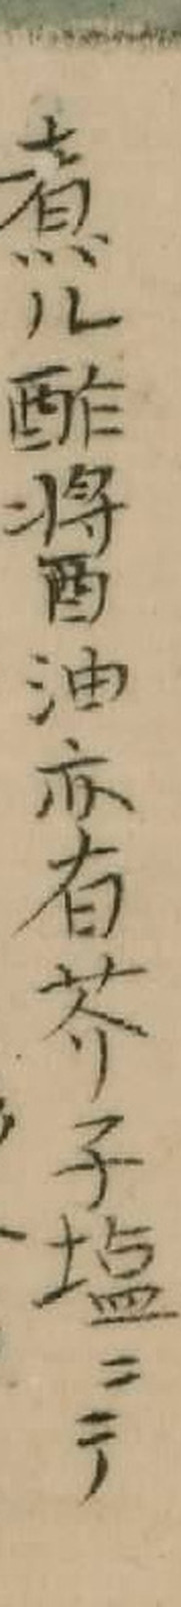煮ル酢醤油亦有芥子塩ニテ
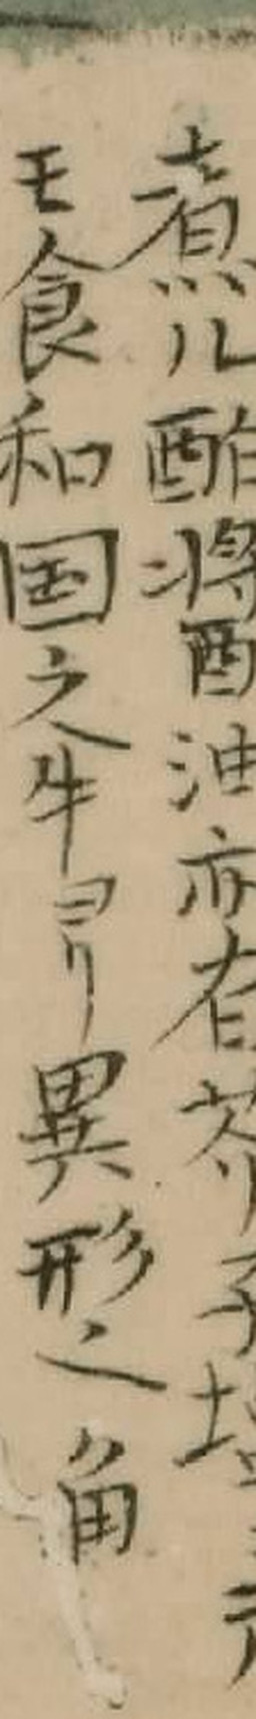モ食和国之牛ヨリ異形也角
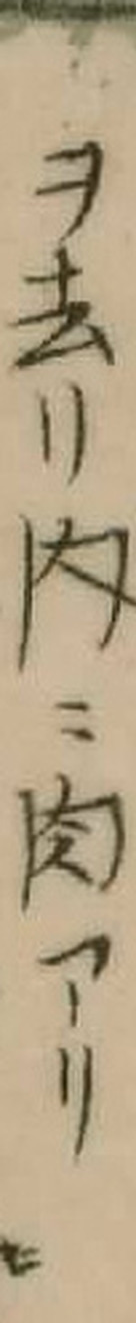ヲ去リ内ニ肉アリ
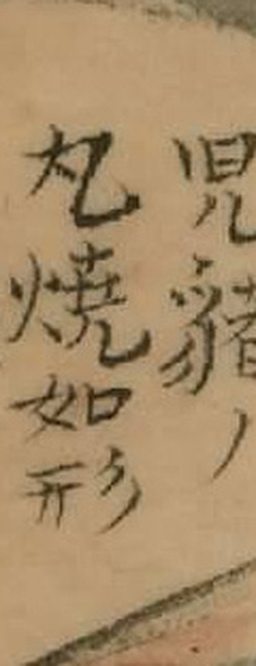丸焼如形
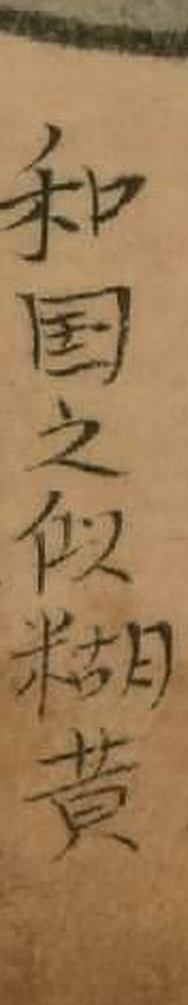和国之似糊黄
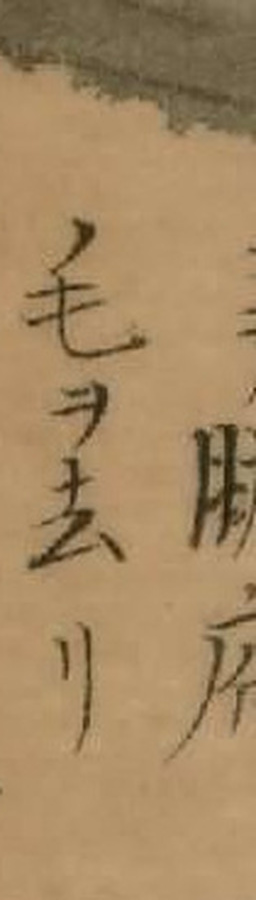毛ヲ去リ
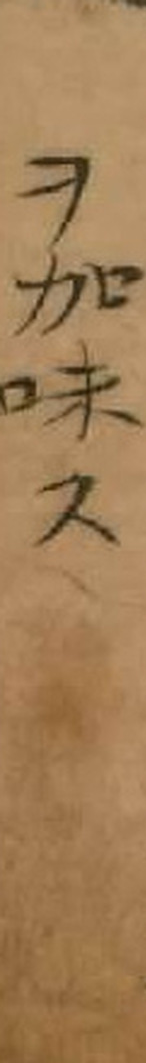ヲ加味ス
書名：和蘭規式料理絵図
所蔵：神戸大学附属図書館 国文学研究資料館
